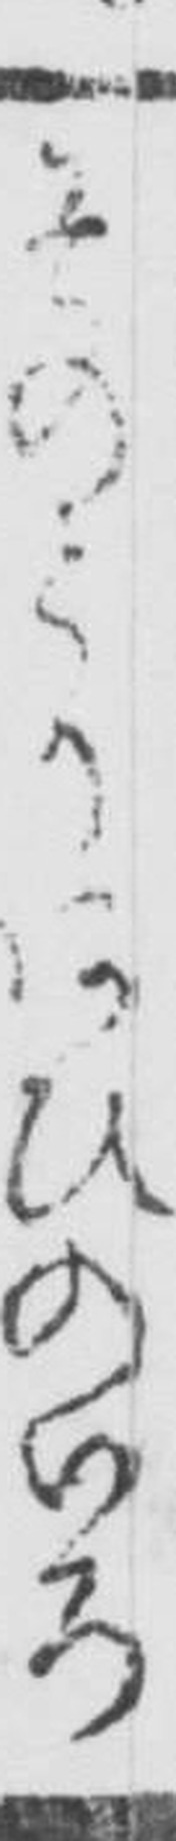そのとりあひのいろ
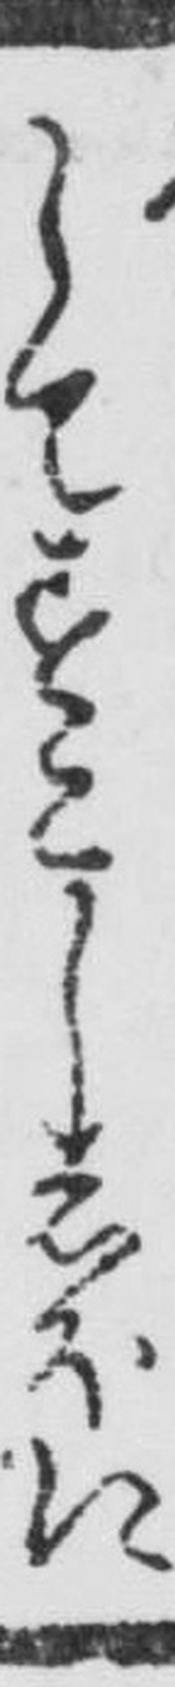してすこししほに
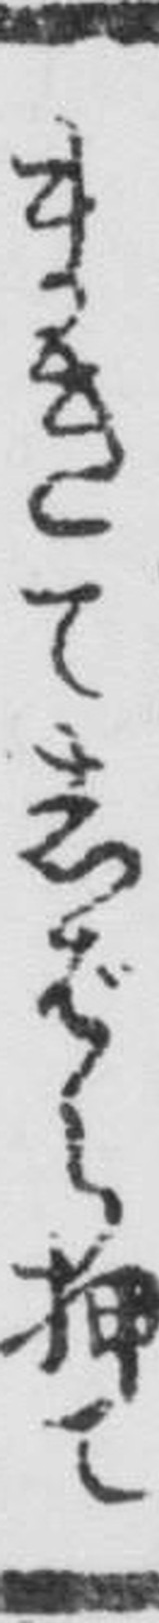まきてしばし押て
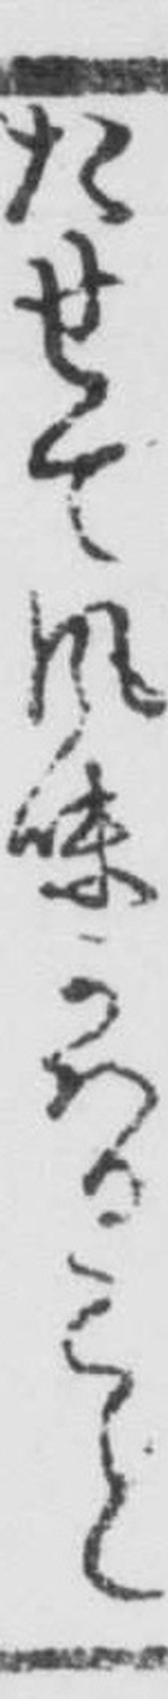たせて風味かはること
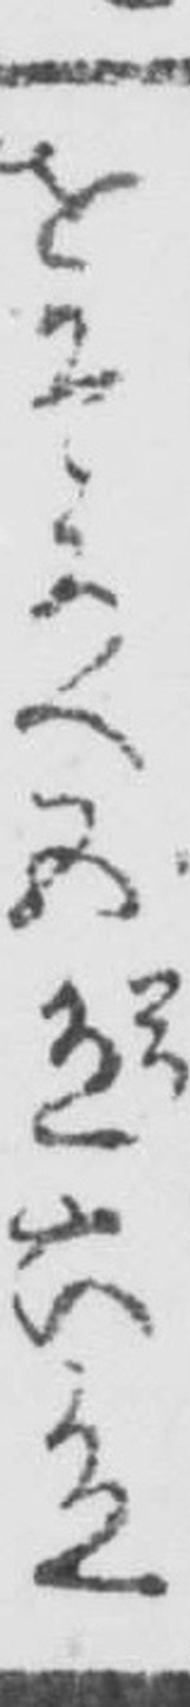をそろへ五色六色
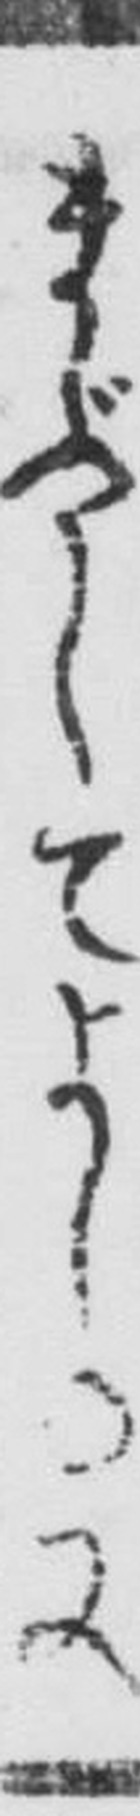まぶしてよし○又
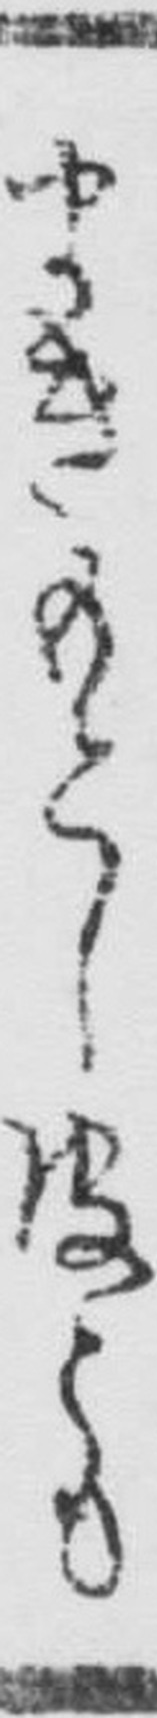まきもとし皮とも
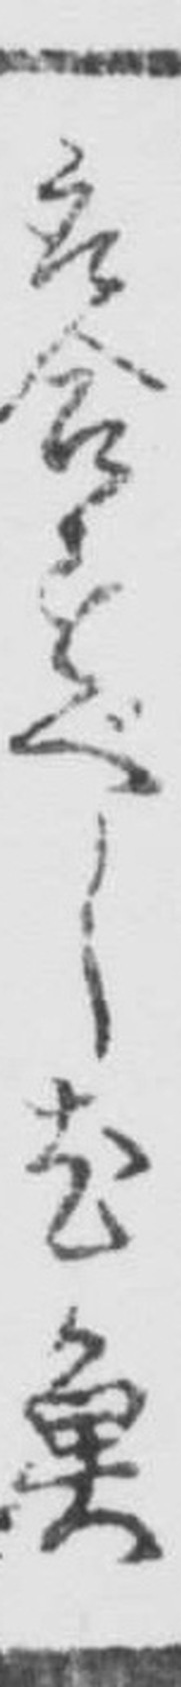取合すべし尤魚
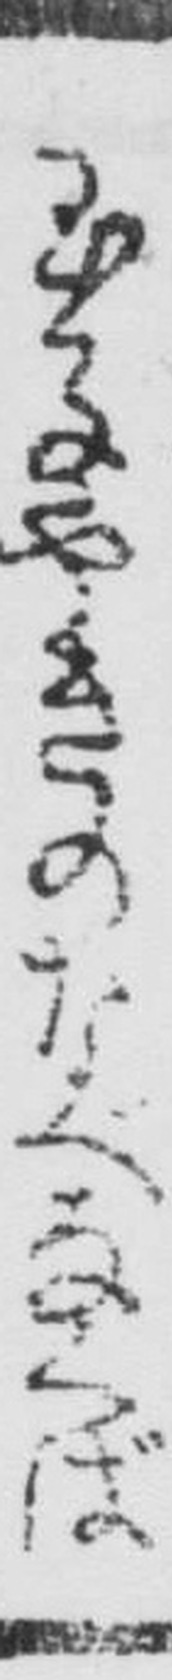玉子やきのなべなくば
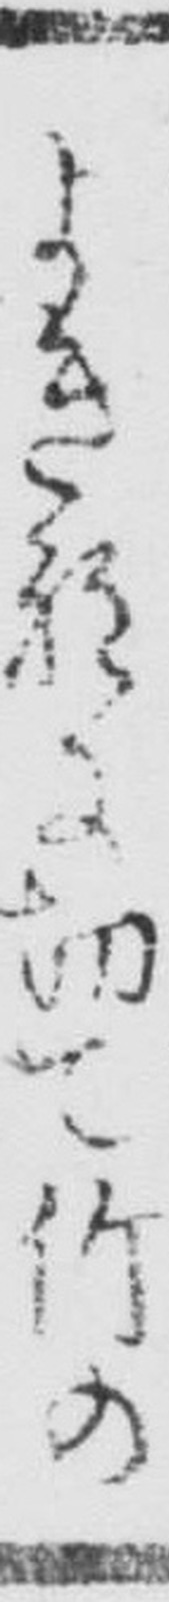よき程に切て竹の
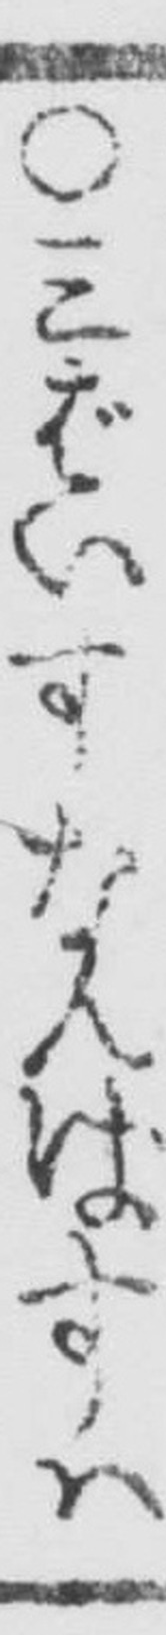○三ばいすなんばすは
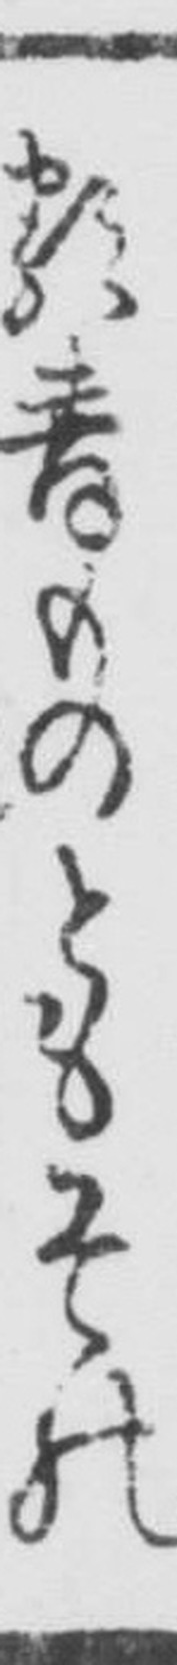類青ものともその
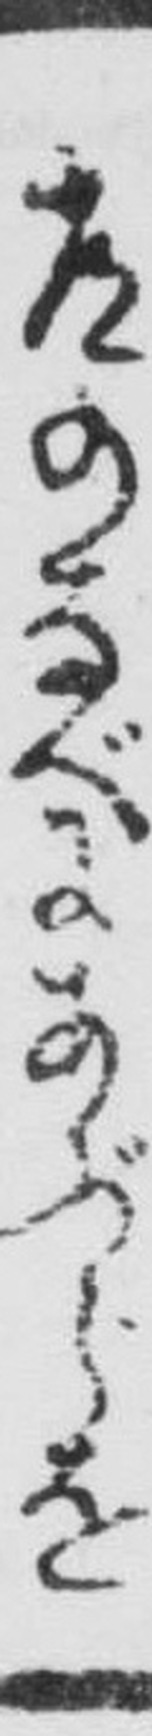常のなべにあぶらを
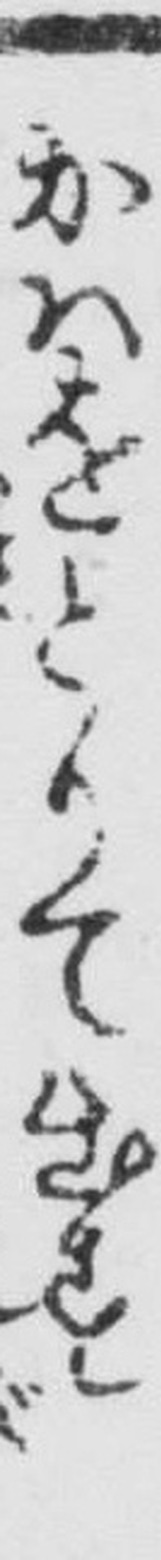かはをとりて出す
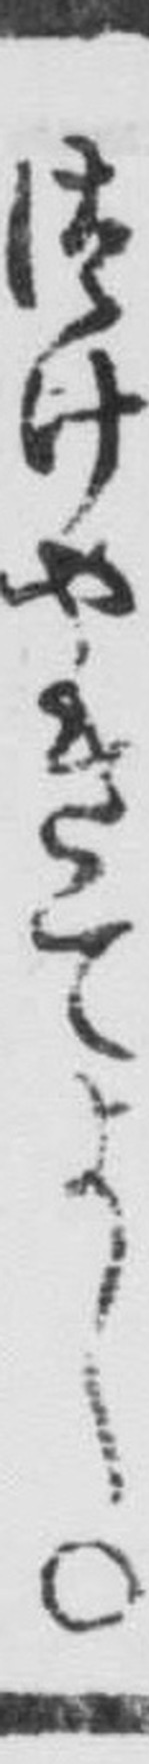つけやきてよし○
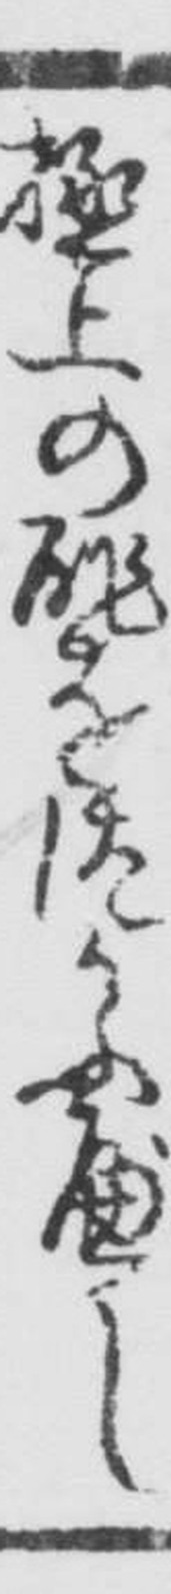極上の酢をつかふべし
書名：諸家通用/即席料理
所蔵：大阪府立大学学術情報センター 国文学研究資料館
